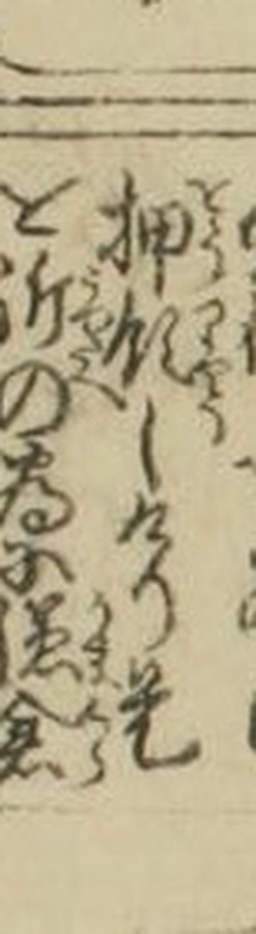を訴の為に鎌倉
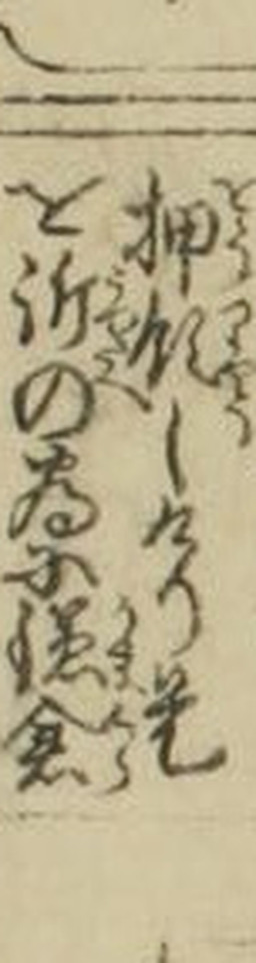を訴の為に鎌倉
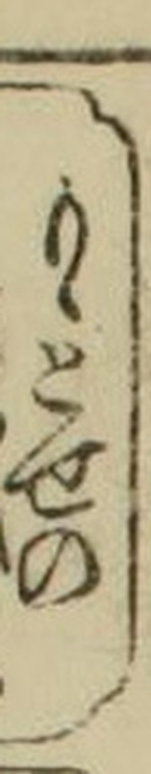もゝとせの
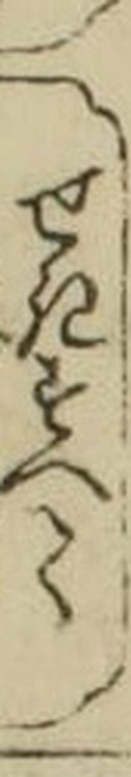せきすへて
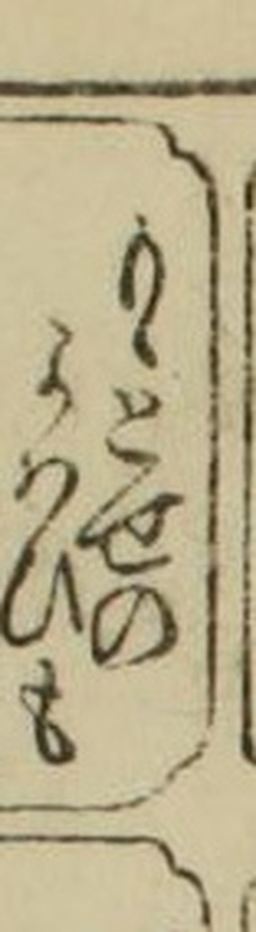よはひも
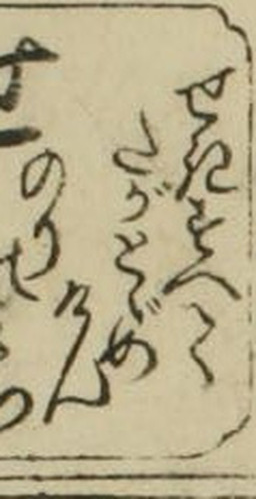たがとゞめ
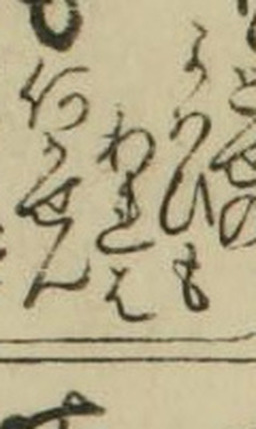われは
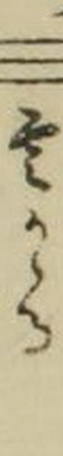雲かゝる
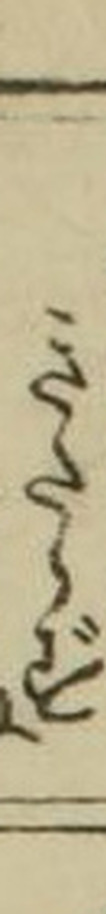きたらず
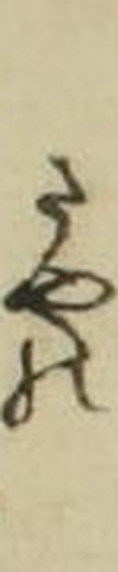さやの
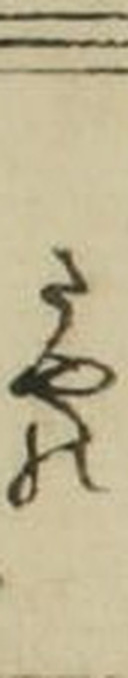さやの
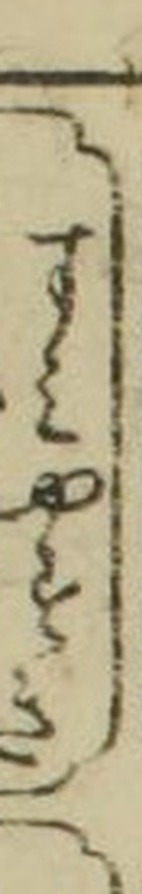すみやすき
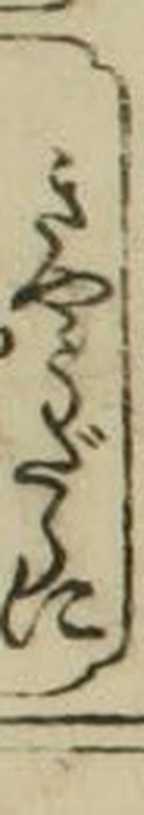きやうだらに
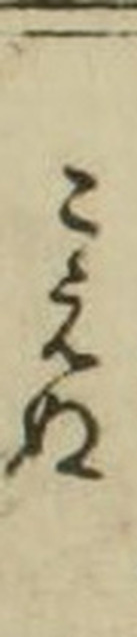こえぬ
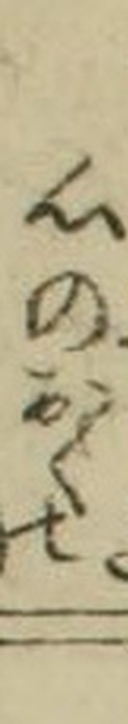心のおくの
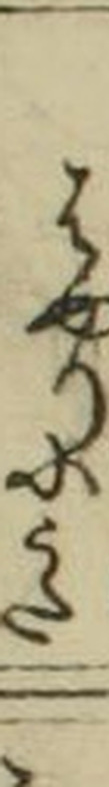はやり小うた
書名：女源氏教訓鑑
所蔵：東京学芸大学附属図書館
